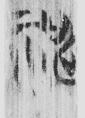神
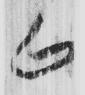㠯（以）
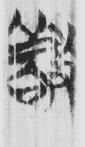敬
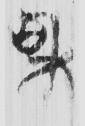和
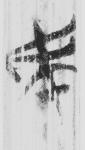民
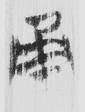甬
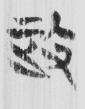政
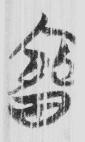{宀留}
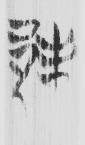邦
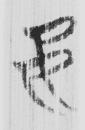妟
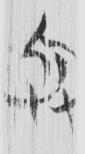兵
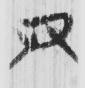四
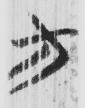方
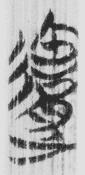達
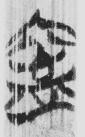{穴心皿}
